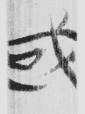或
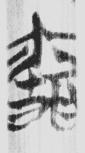{尒䎽}
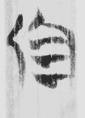於
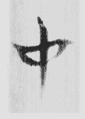中
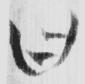曰
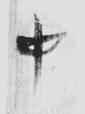中
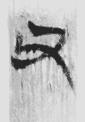父
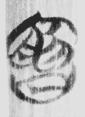{龜日}
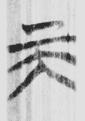天
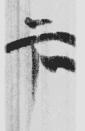下
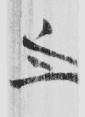之
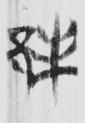邦
